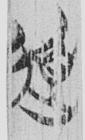道
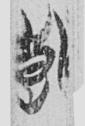朝（昭）
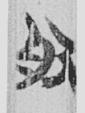肰（然）
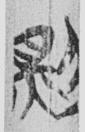則
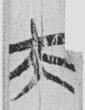夫
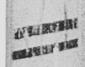二
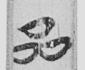厽（三）
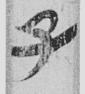子
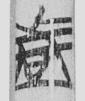者
